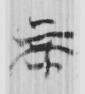不
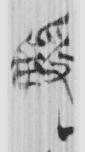援
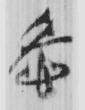{旡心}
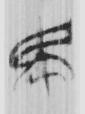民
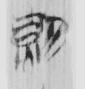則
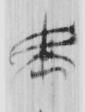民
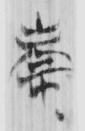考
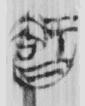智
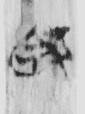臤
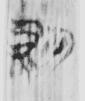則
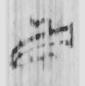民
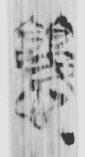懽
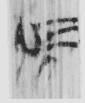倀
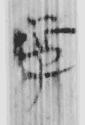乳
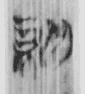則
